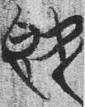既
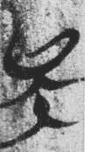矣
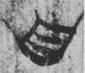自
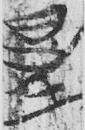{是壬}（是）
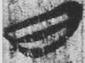日
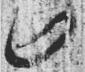㠯（以）
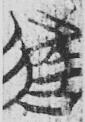○（往）
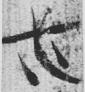必（比）
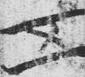五
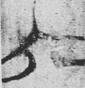六
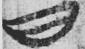日
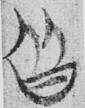皆
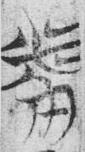○（敝）
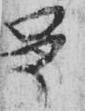邑
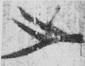之
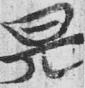○（期）
